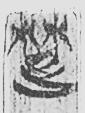楚
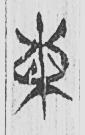柬
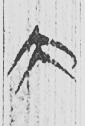大
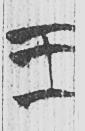王
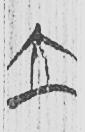立
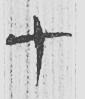七
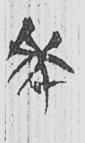年
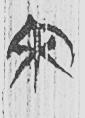宋
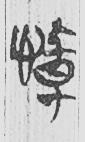悼
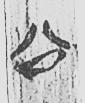公
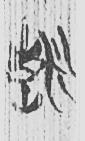朝
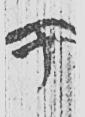于
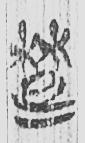楚
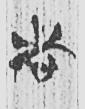告
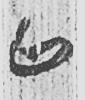㠯（以）
